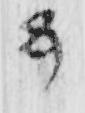邑
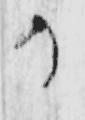人
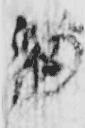紫
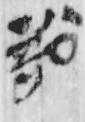訟
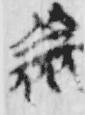羕
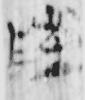陵
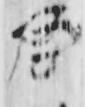君
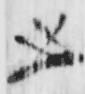之
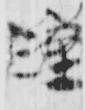○（陳）
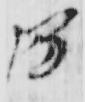泉（淵）
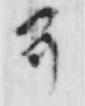邑
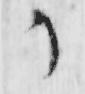人
